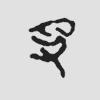𠭁
